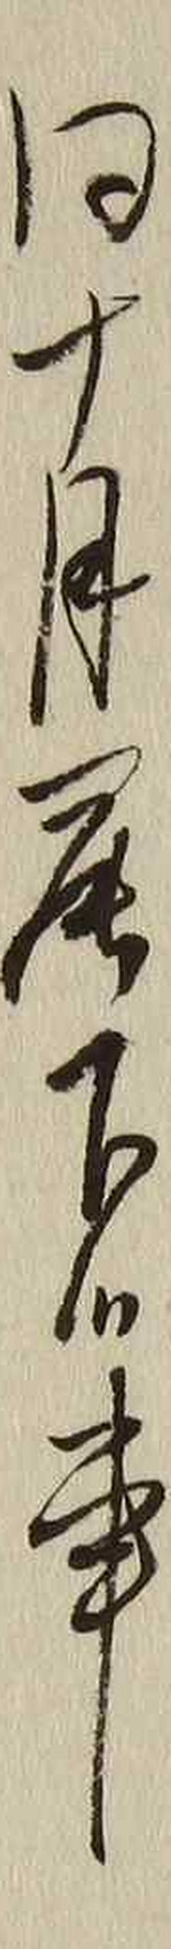同十月罷下候事
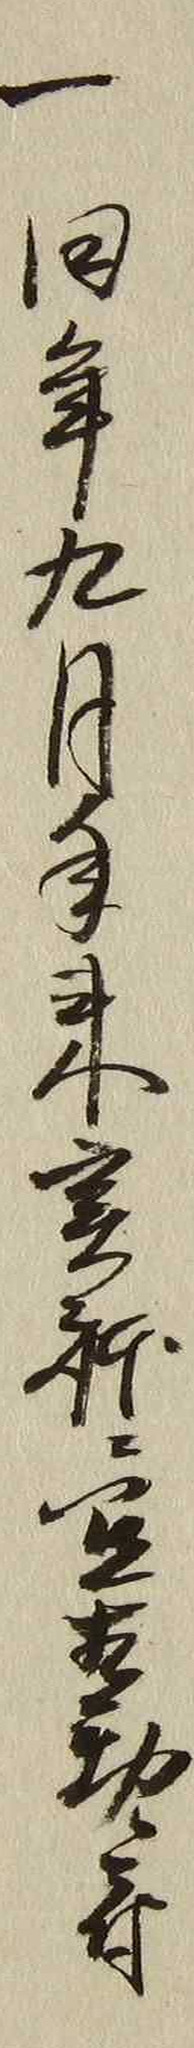一同年九月年来実体ニ宜相勤候ニ付
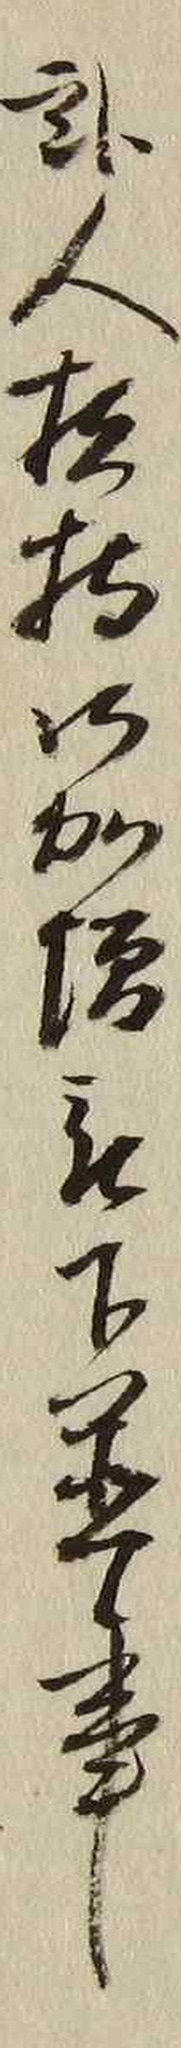弐人扶持御加増被下置候事
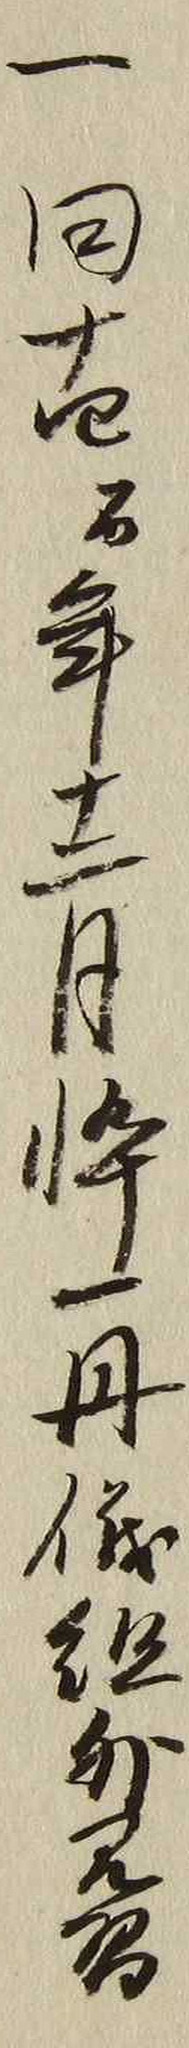一同十四酉年十二月忰一丹儀組外見習
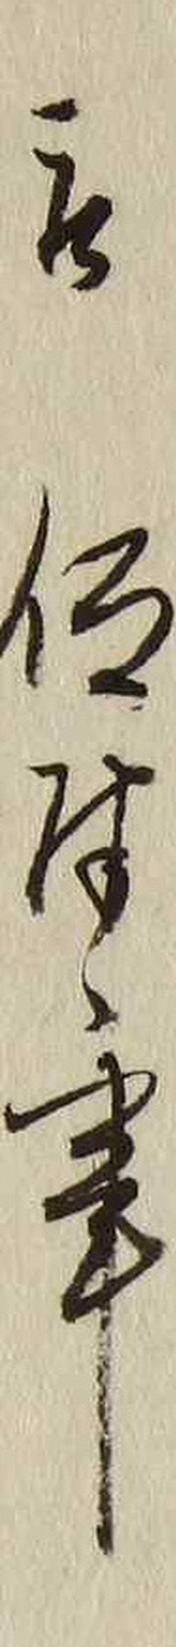被仰付候事
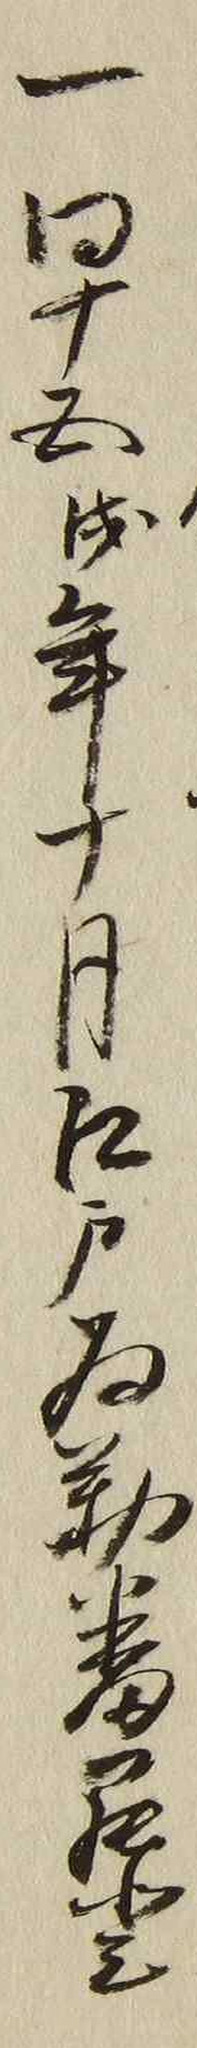一同十五戌年十月江戸為勤番罷登
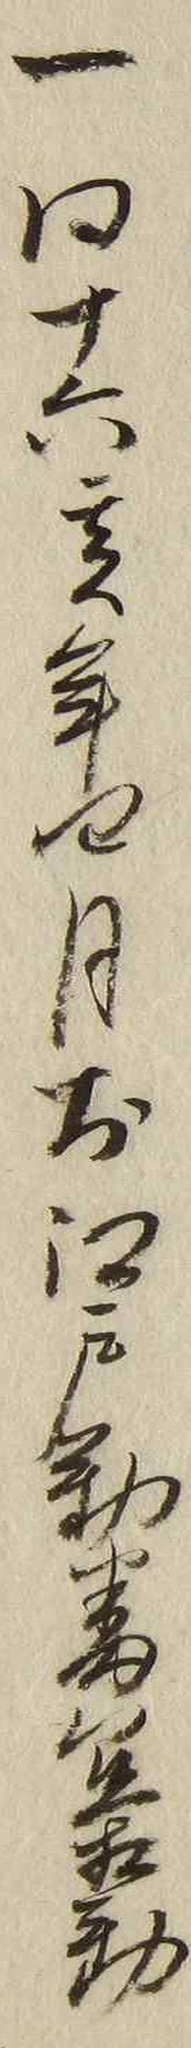一同十六亥年四月於江戸勤番宜相勤

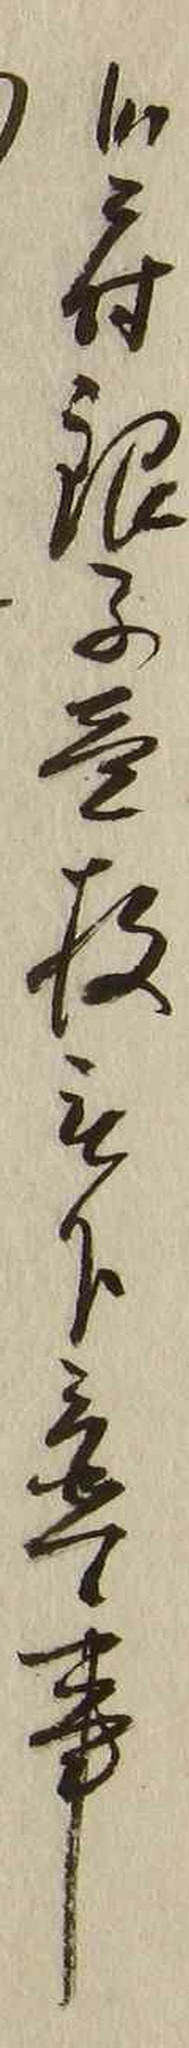候ニ付銀子壱枚被下置候事
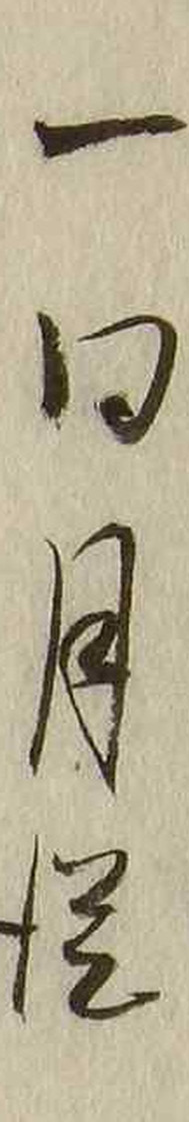一同月従
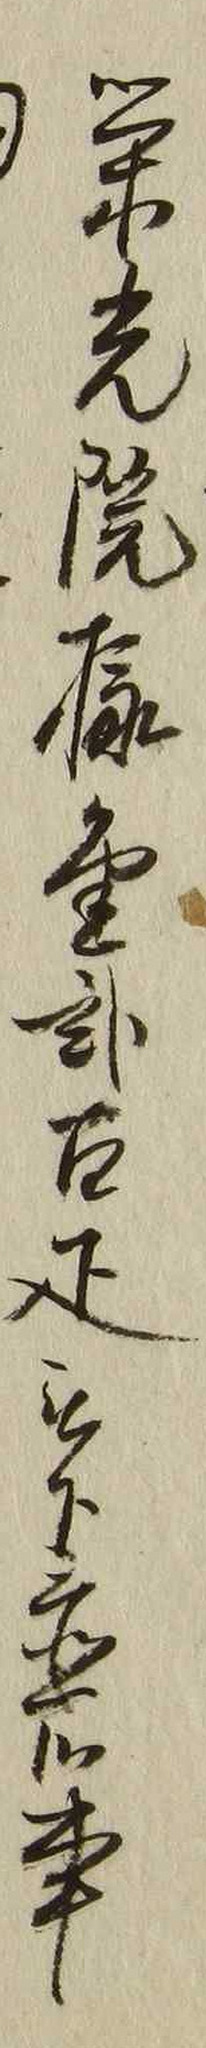栄光院様金弐百疋被下置候事
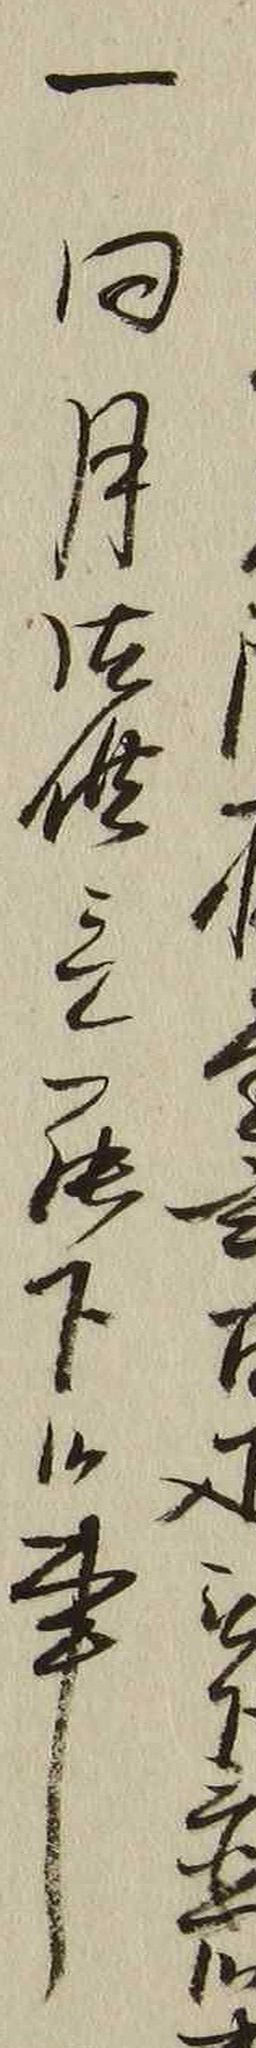一同月御供ニて罷下候事
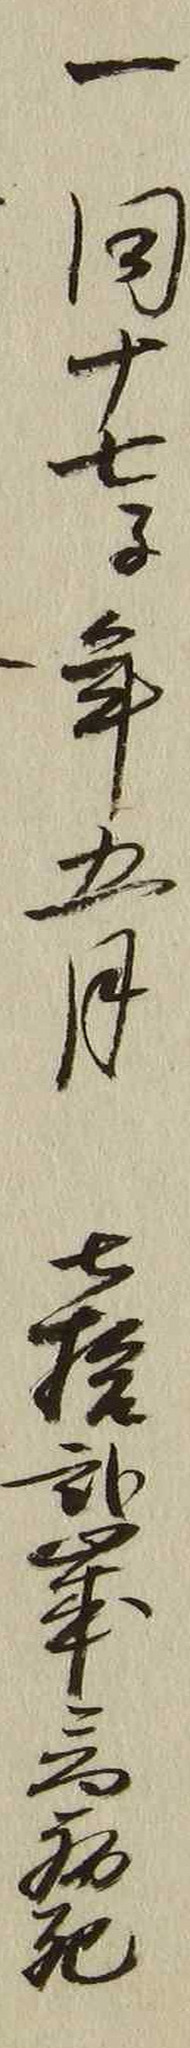一同十七子年五月七拾弐歳ニ而病死
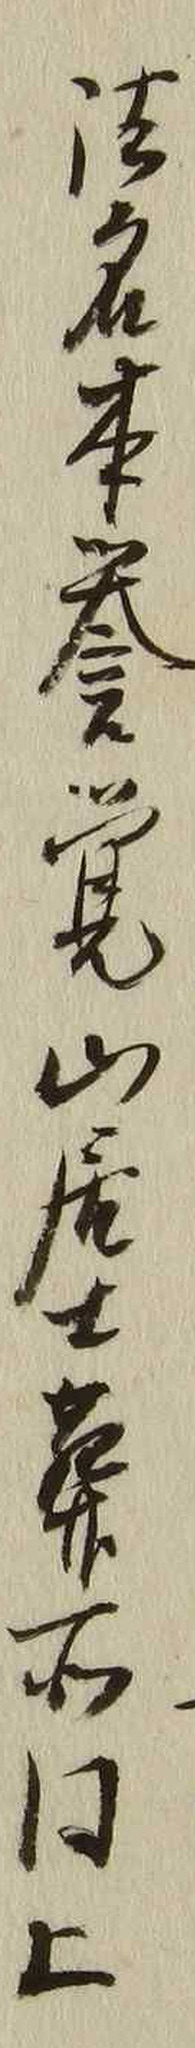法名本誉覚山居士葬所同上
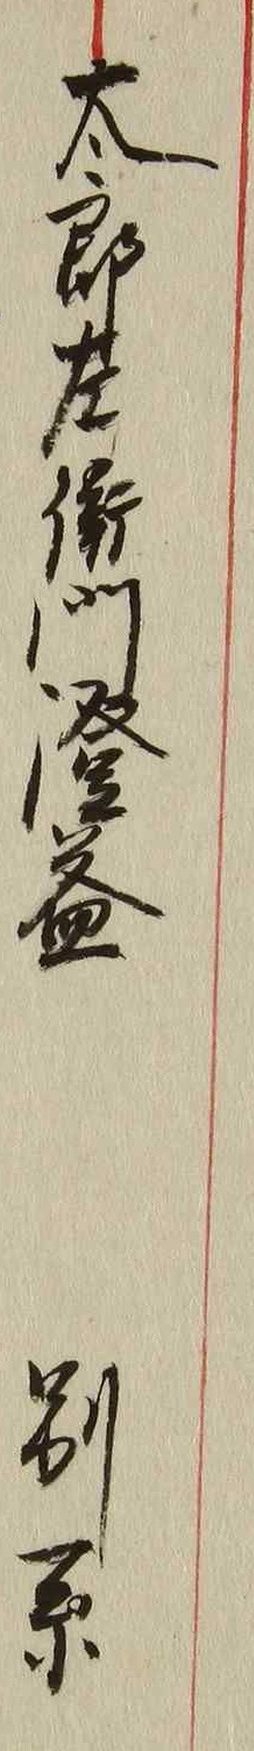太郎左衛門澄益別系
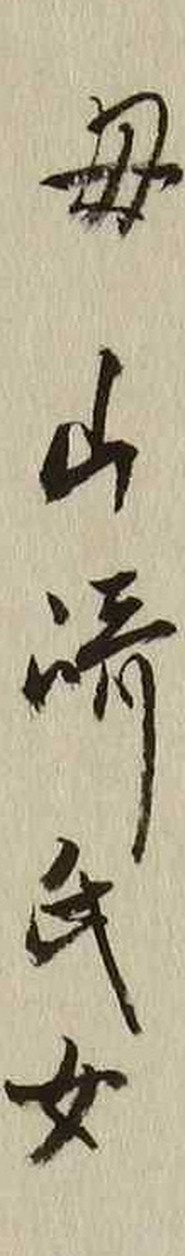母山崎氏女
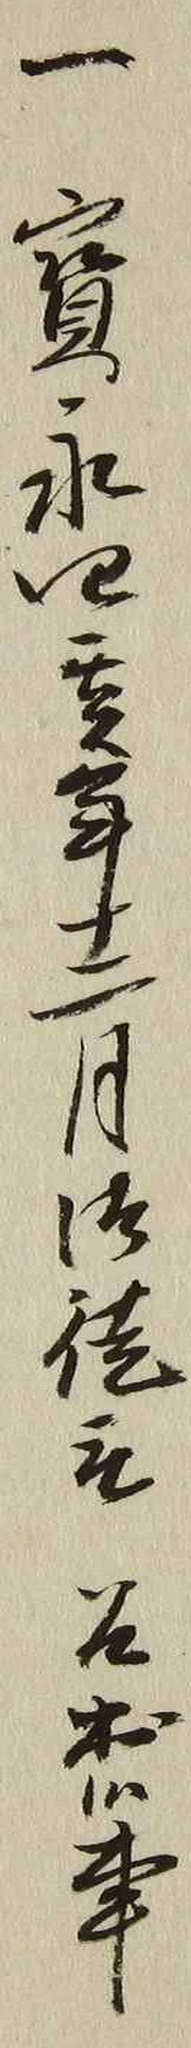一宝永四亥年十二月御徒被召出候事
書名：諸士系譜　巻之349　も之部5
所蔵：会津若松市立会津図書館
